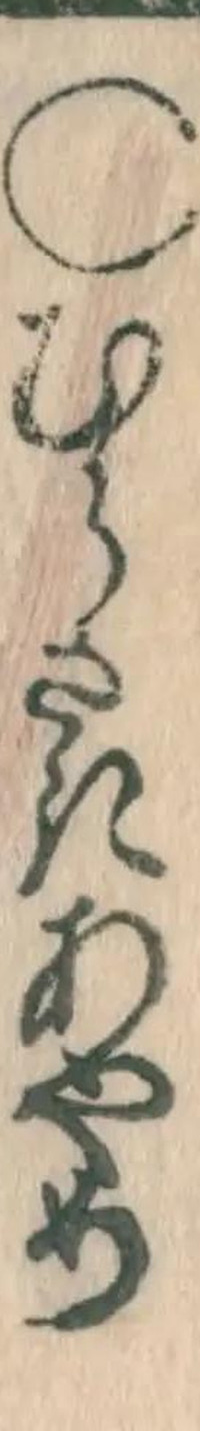〇むらさきあやめ
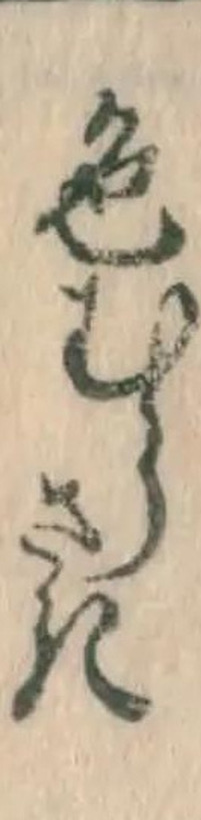色むらさき
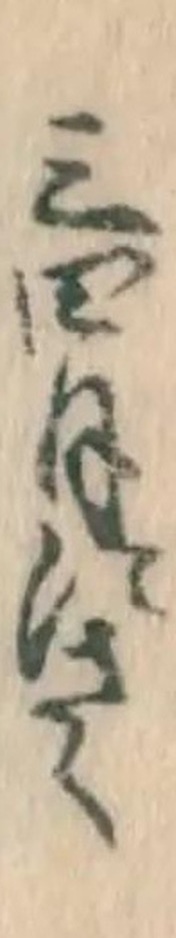三四月にさく
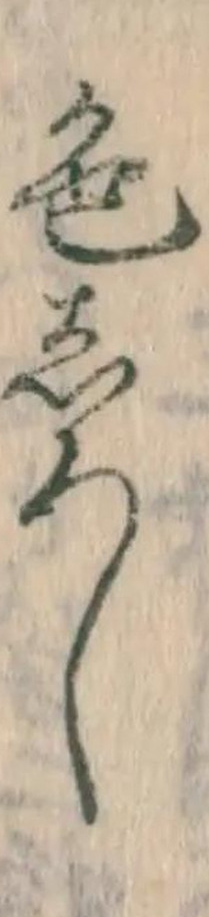色しろく
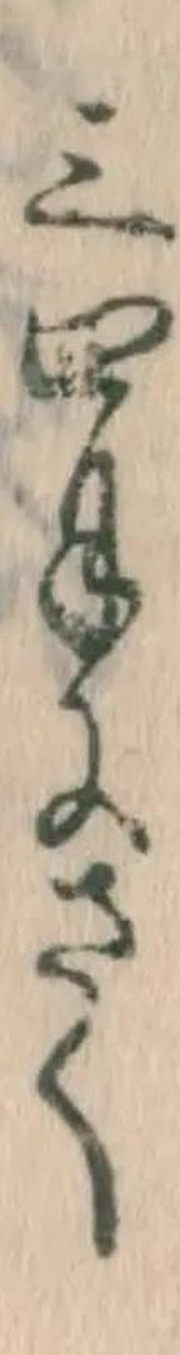三四月にさく
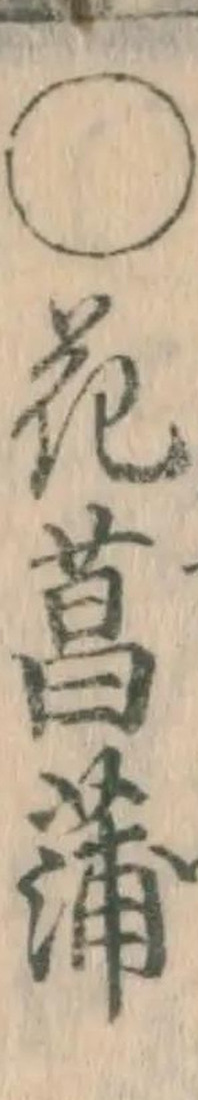〇花菖蒲
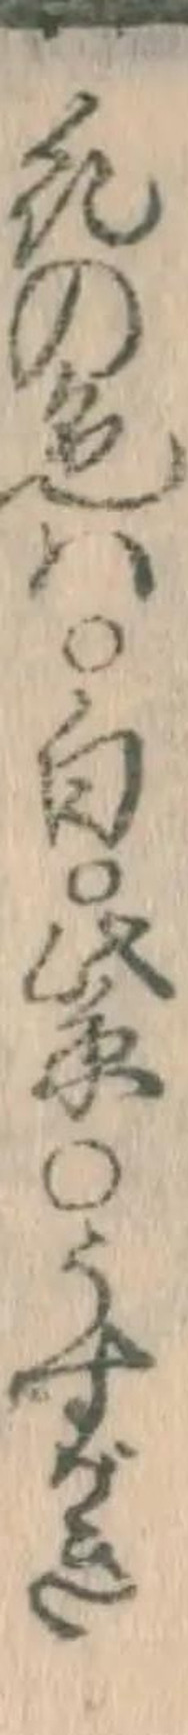花の色は〇白〇紫〇うすがき
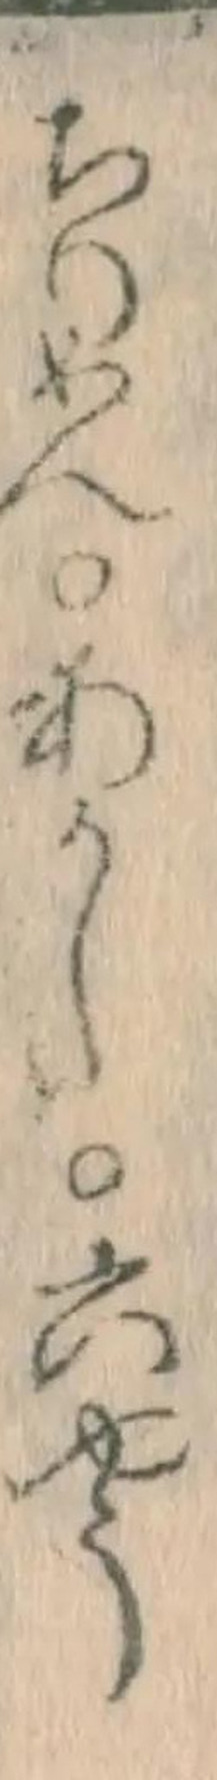ちりめん〇あかく〇六やう
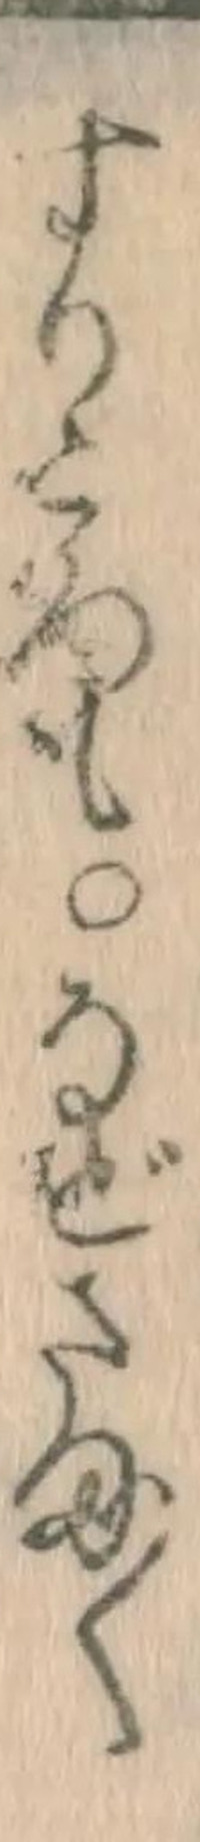すりころも？〇などさま〳〵
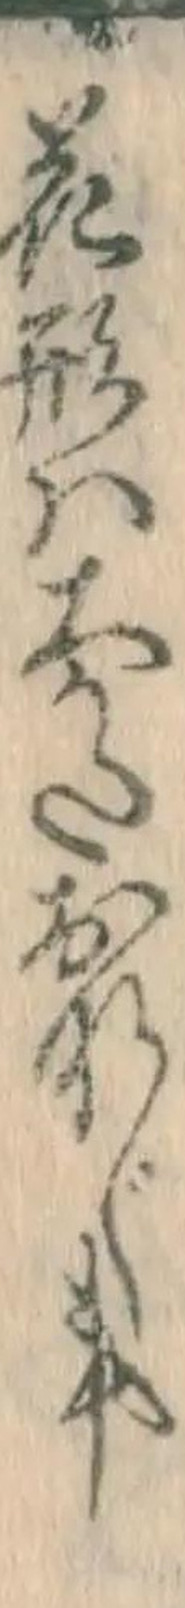花形は大かたおなじ事
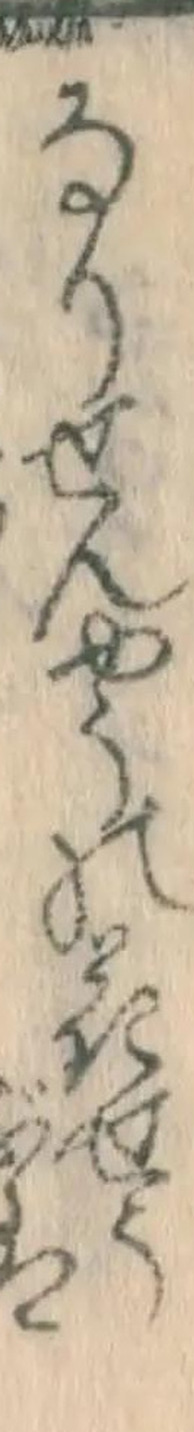なりせんやうの花せう
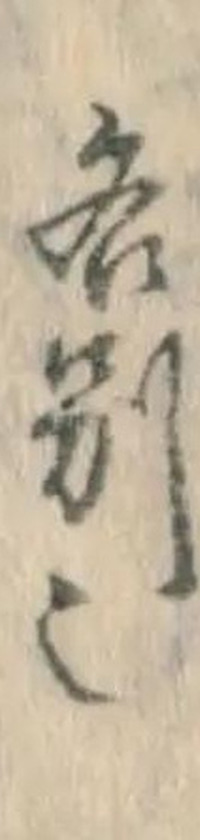各別也
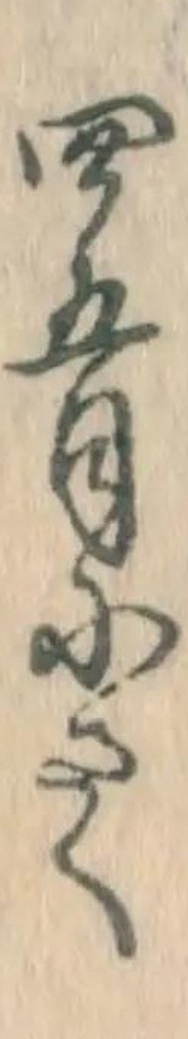四五月にさく

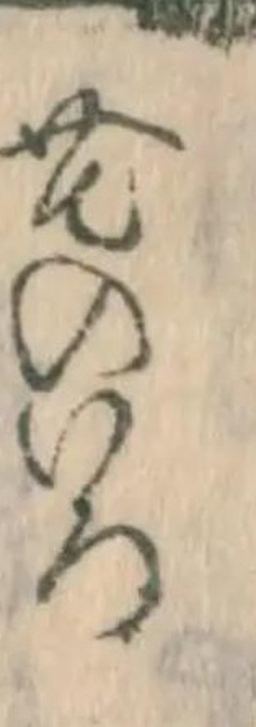花のいろ
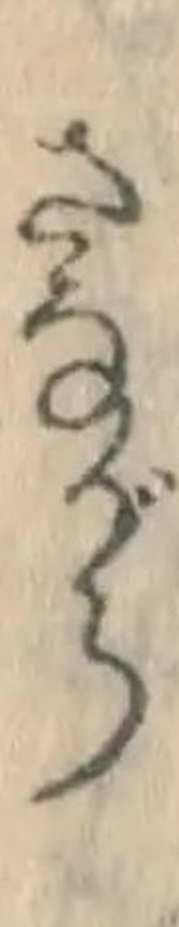さながら
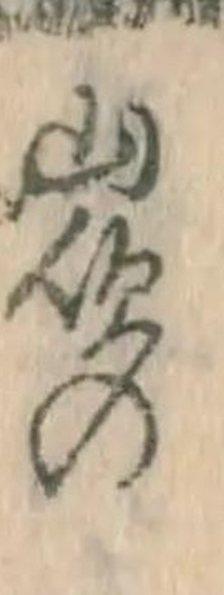山吹の
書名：艸花繪前集. [2]
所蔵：国立国会図書館 National Diet Library, JAPAN
